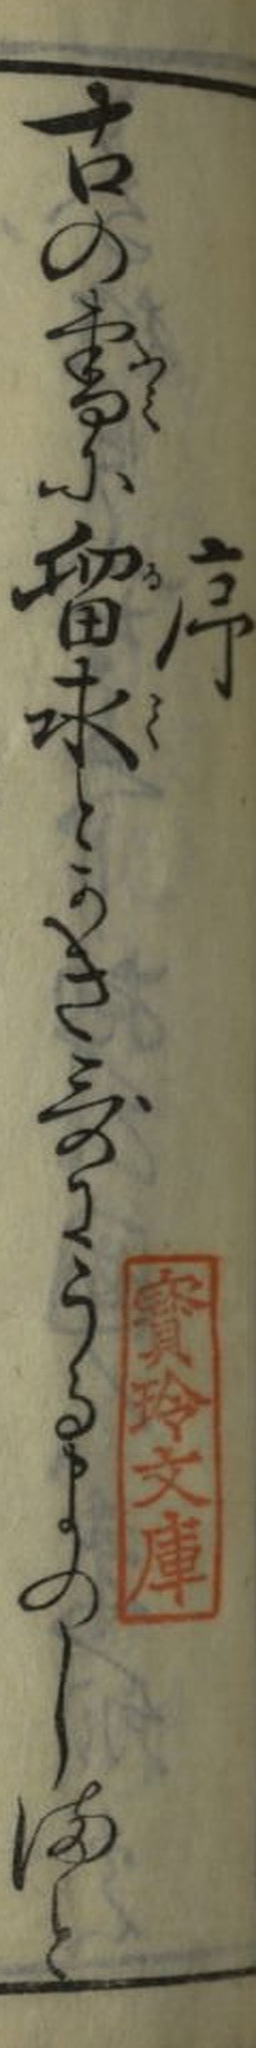古の書に留求とかき哥にうるまのしまと
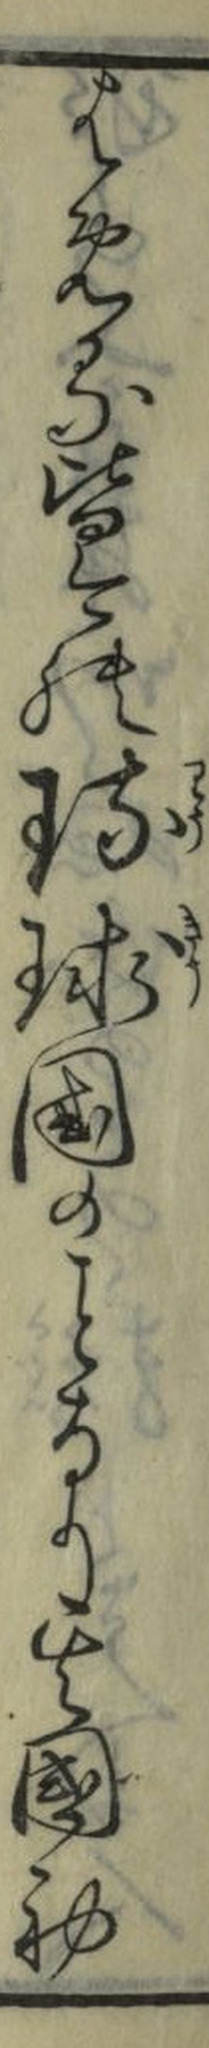よめる皆今の琉球国のことなり其国初
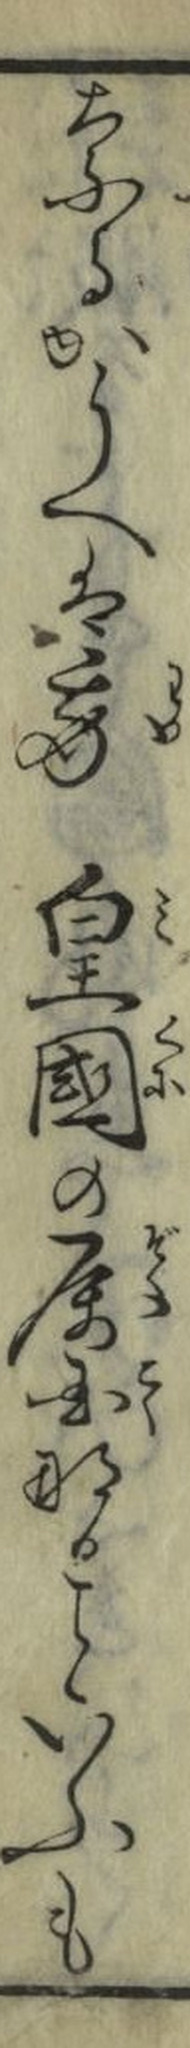なるかうへは我皇国の属国なることいふも
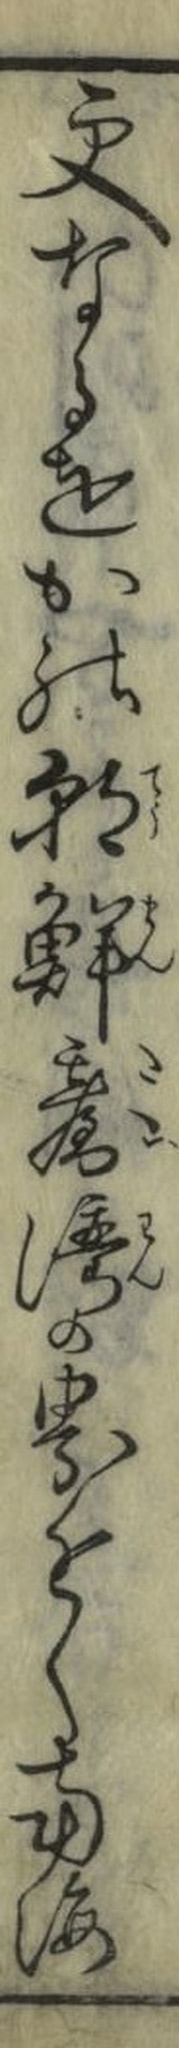更なるをかの朝鮮台湾の界をく南海
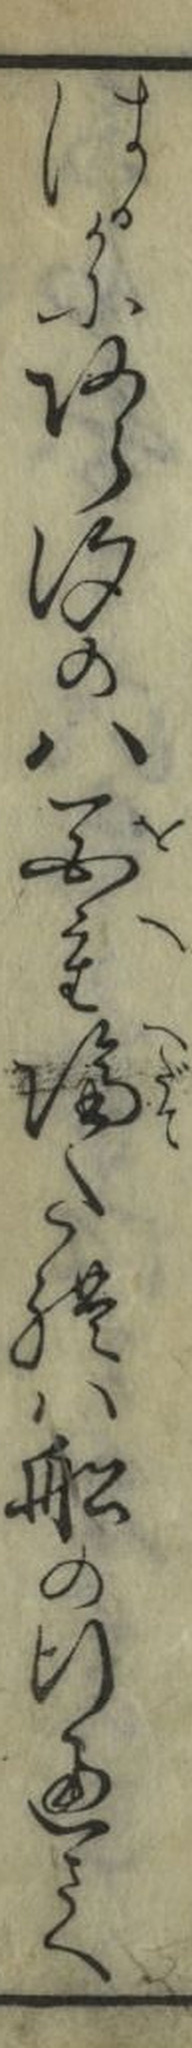はるかにあら汐の八百重隔たれは船の行へさへ

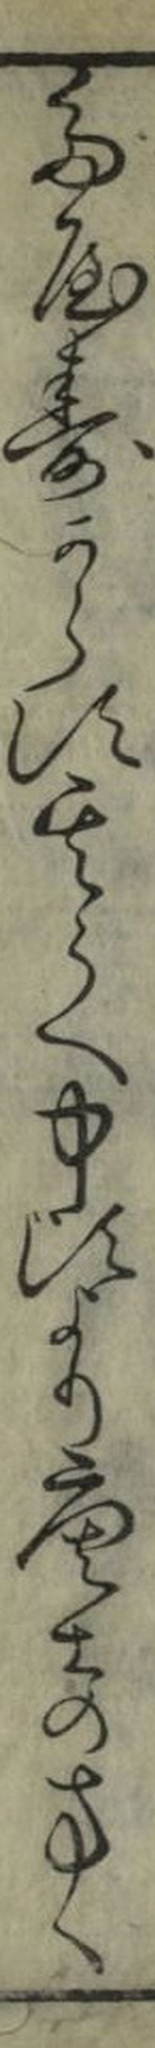たやすからす其うへ中頃より唐土の方へ
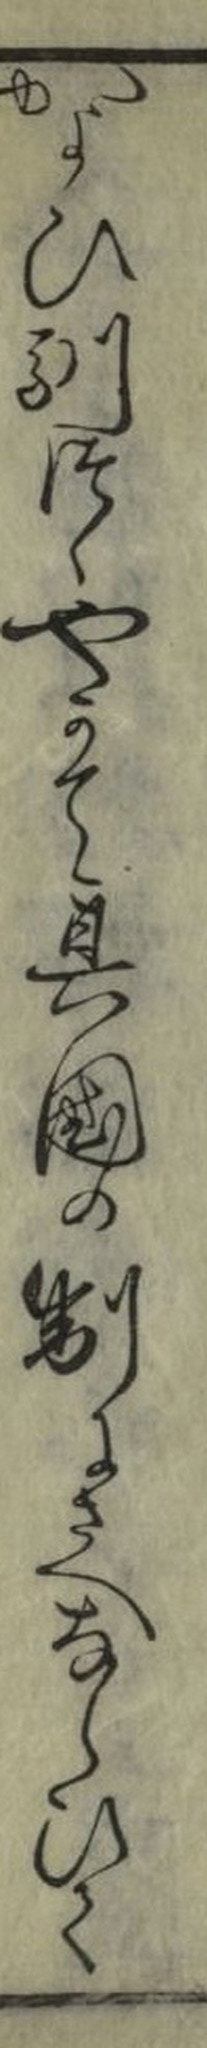かよひ馴つゝやかて其国の制にさへならひて
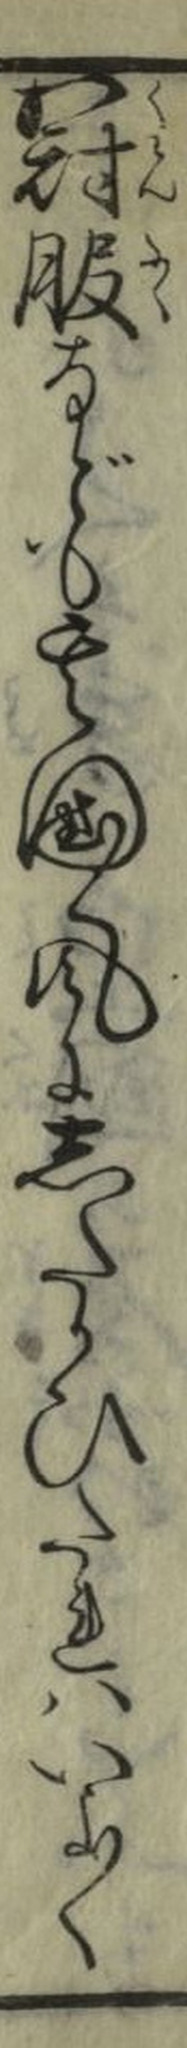冠服なども其国風にしたかひたれはいよ〳〵
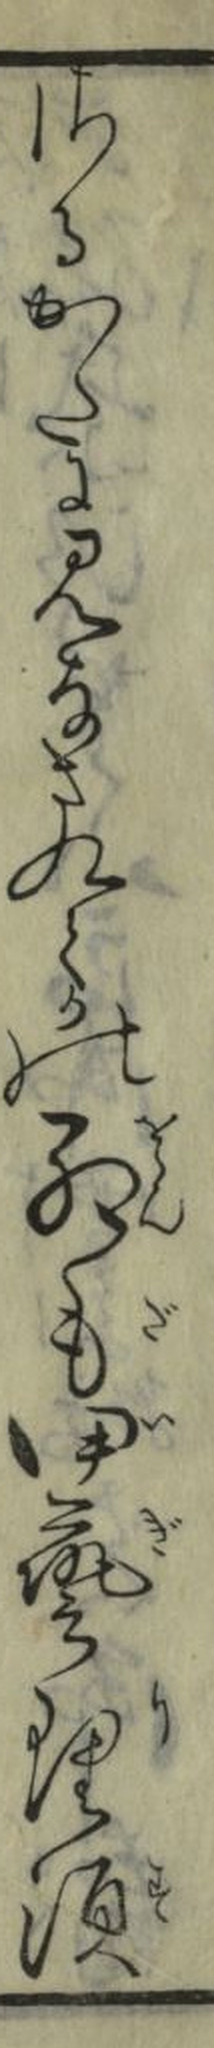さるかたに見なされてかの紅毛伊芸理須
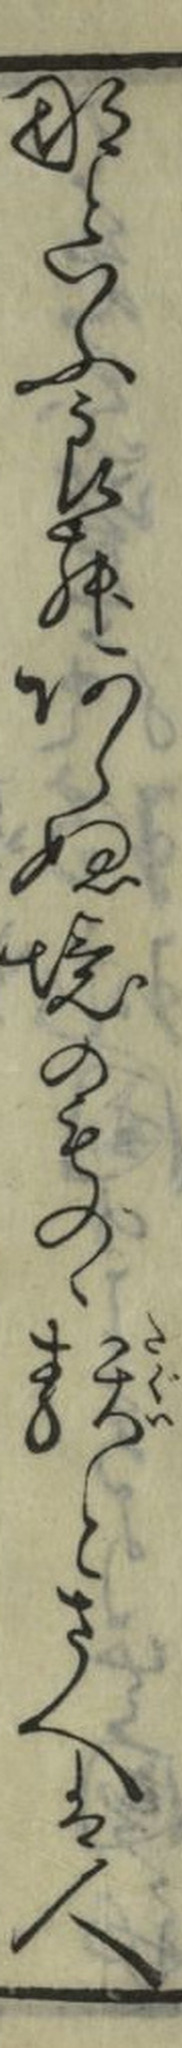なといふらむあらぬ境のものゝ類とさへは人
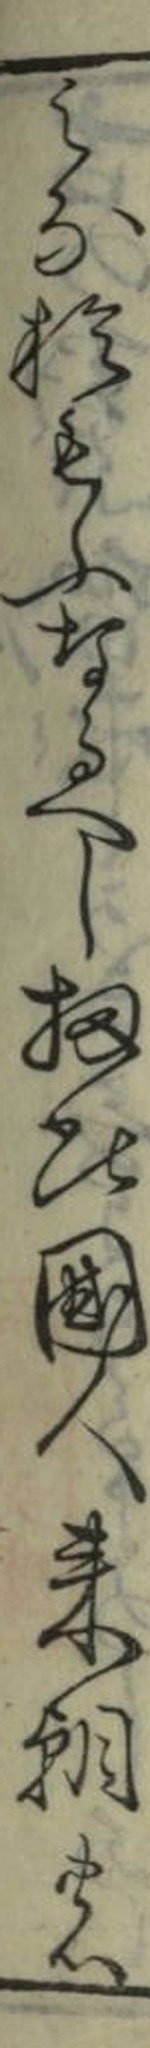みなおもふなるへし扨此国人来朝の
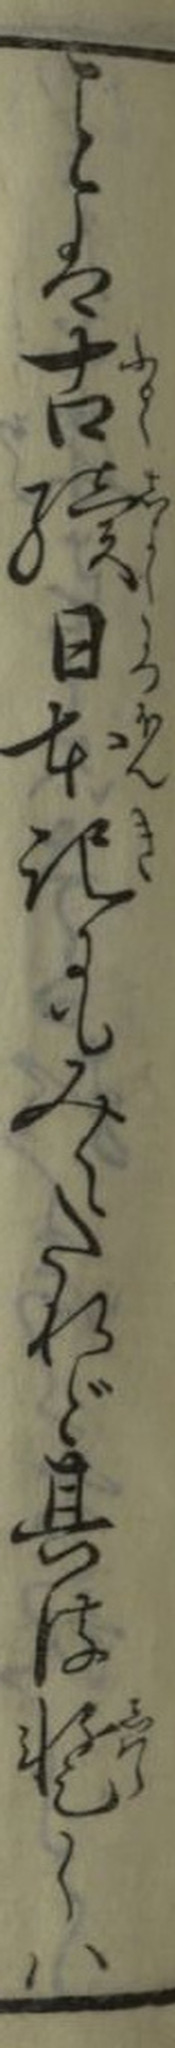ことは古続日本記にもみえたれど其後暫くは
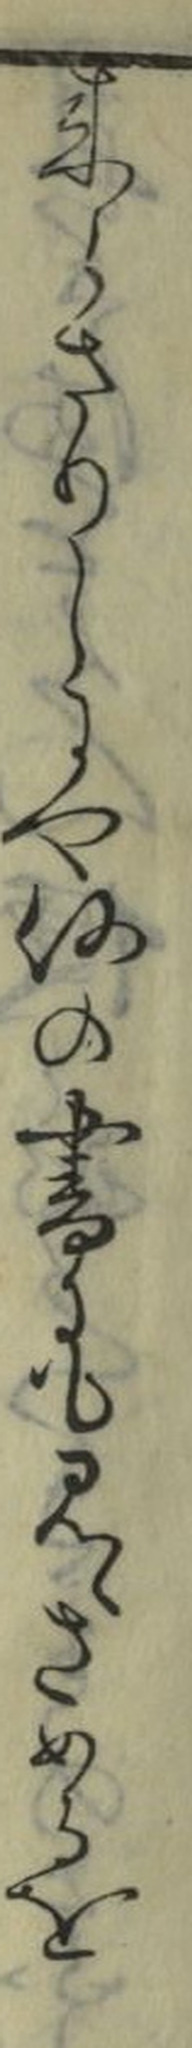来らさりしにや何の書にも見へさめるを
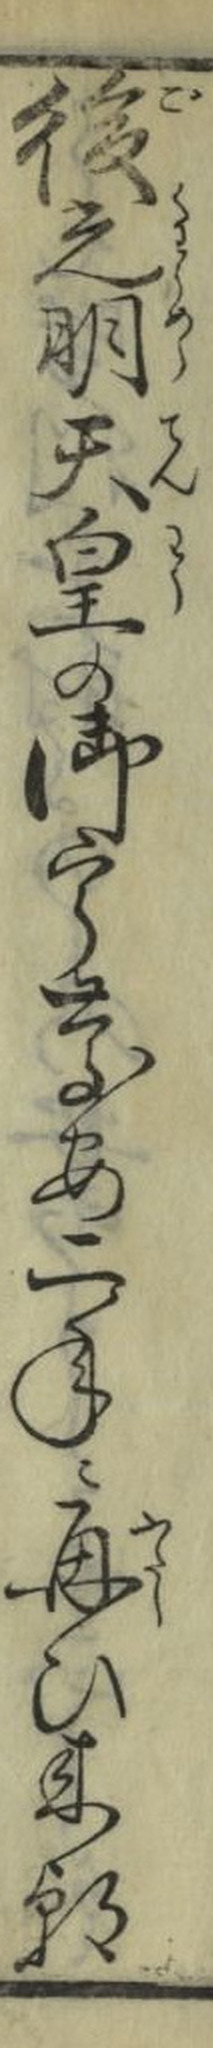後光明天皇の御宇慶安二年に再ひ来朝
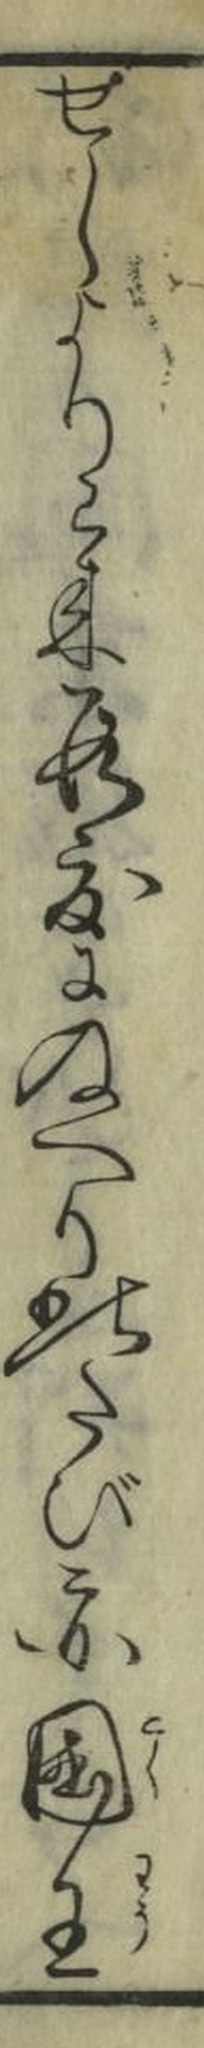せしより已来毎度に及へり此たび亦国王
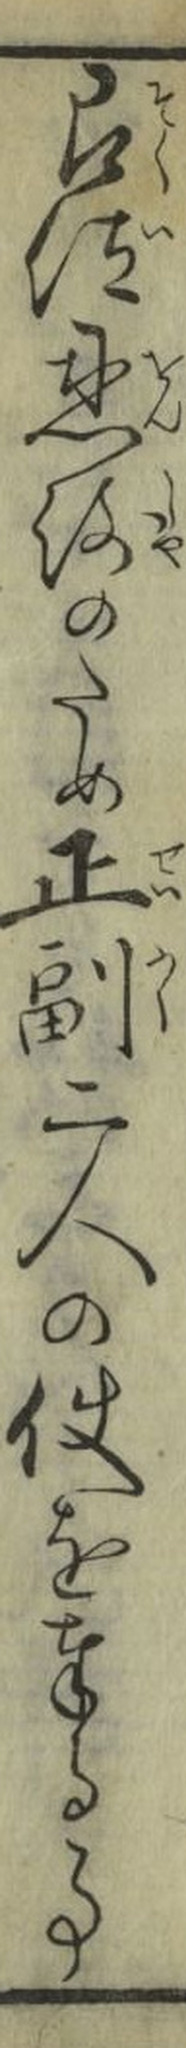即位恩謝のため正副二人の使を奉る事
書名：琉球人行列記
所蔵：University of the Ryukyus Library
